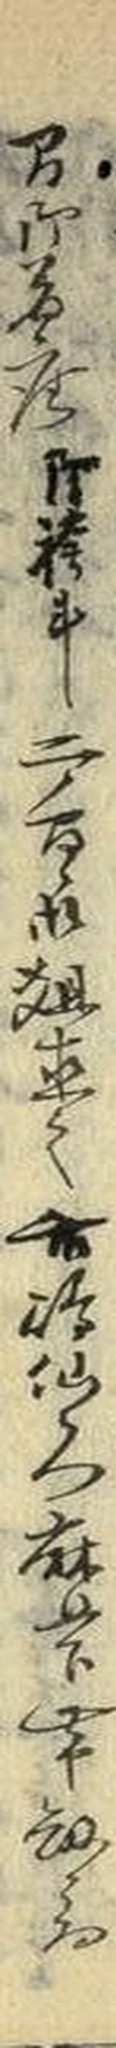間御着座御袴斗二ノ間へ御俎直之竹嶋仙右衛門麻上下帯剣ニ而
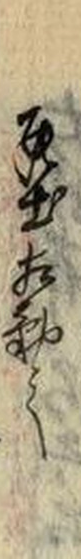罷出相勤之
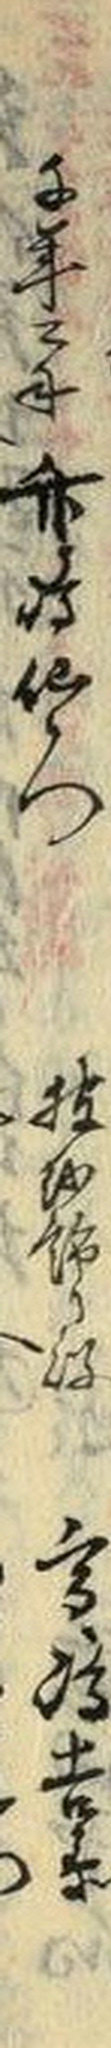千年之手竹嶋仙右衛門服紗飾り役高嶋吉兵衛
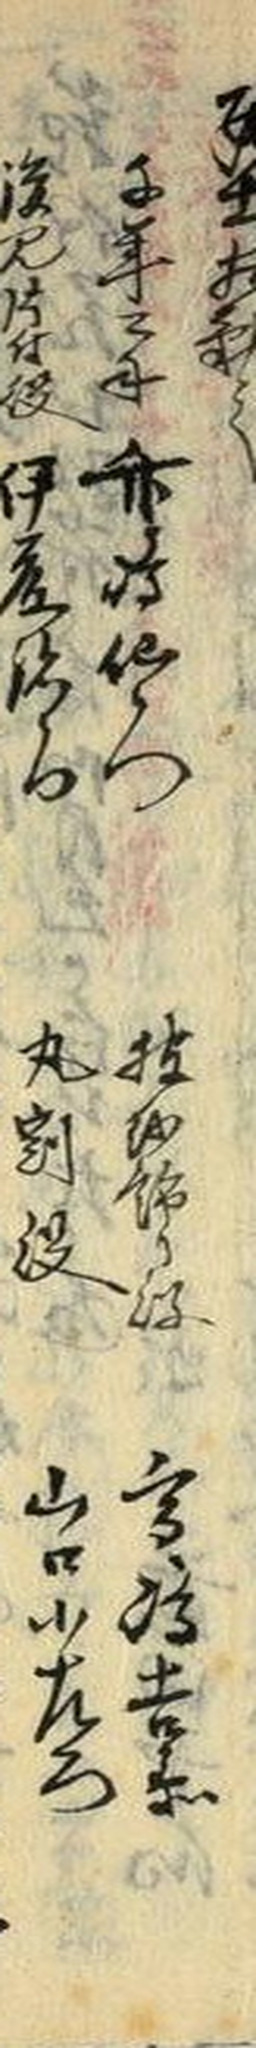後見片付役伊藤弥右衛門丸割役山口小左衛門
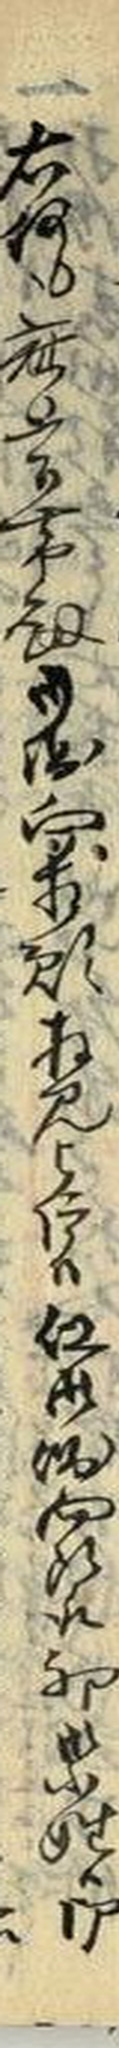右何も麻上下帯剣御側向相願拝見被仰付但御側向頭取初御小姓ハ御
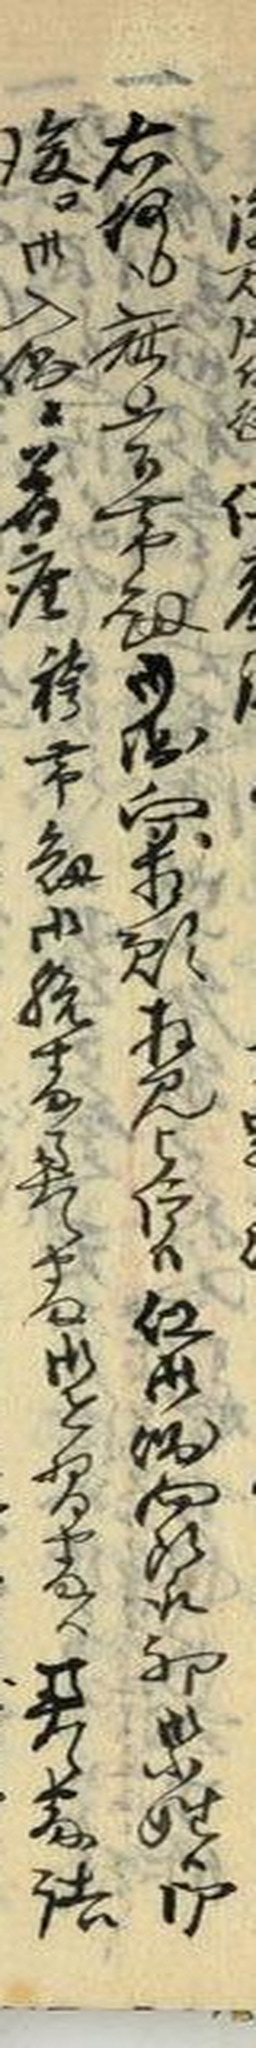後口御入側ニ着座袴帯剣御膳番奥之番御近習番ハ奥之番詰
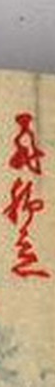飛脚立
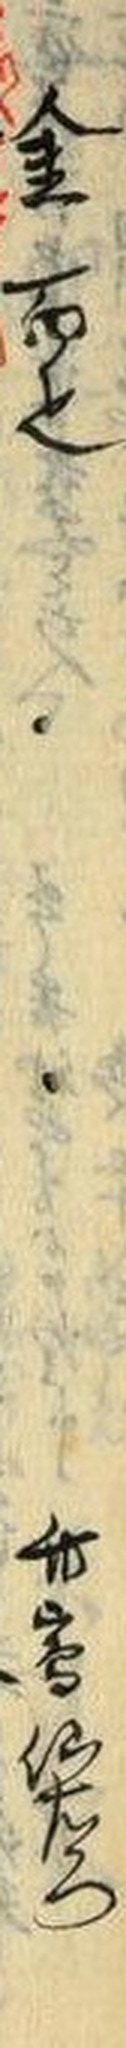金百疋竹嶋仙右衛門
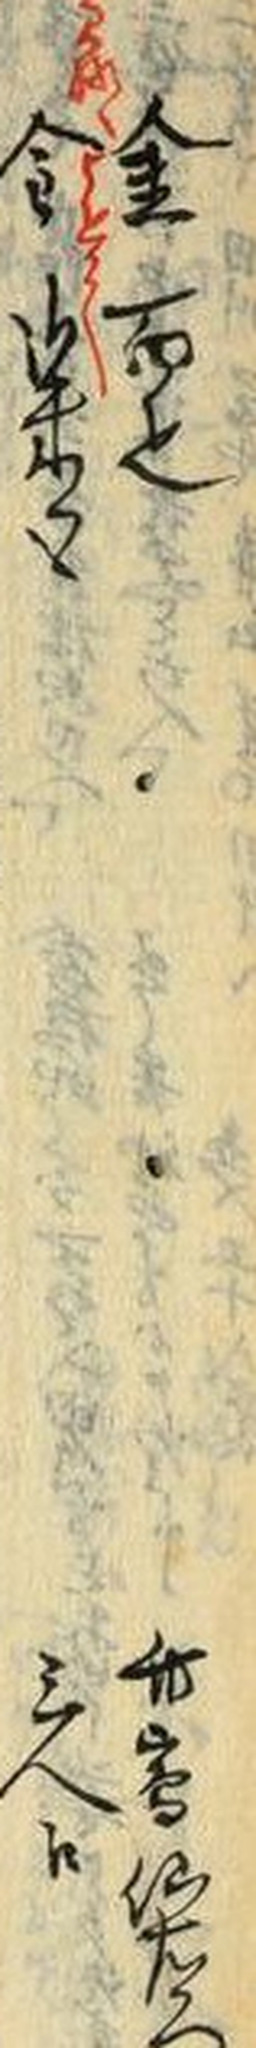金弐朱ツヽ三人江
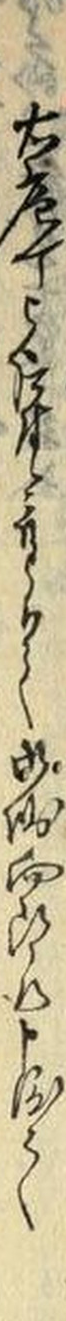右庖丁被仰出候ニ付被下之御側向頭取申渡之
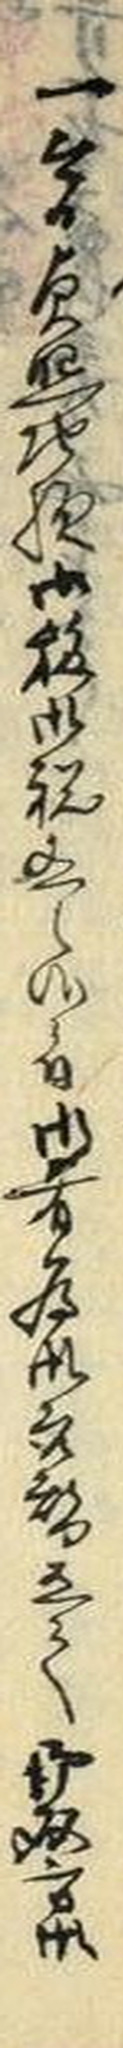一今日貞照院様御移御祝有之候ニ付御肴為御取替有之御双方御
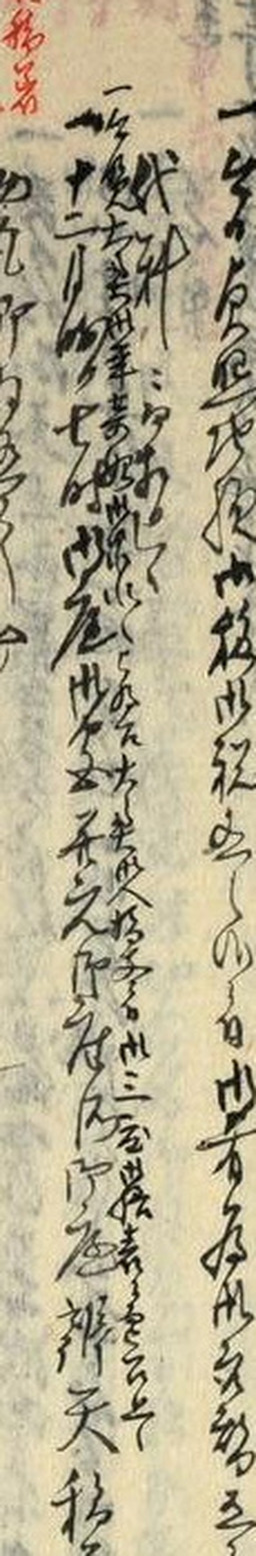一今晩大奥御年寄始御泉水へ被為召大奥御人指支ニ付御三度御膳表ニ而被召上候
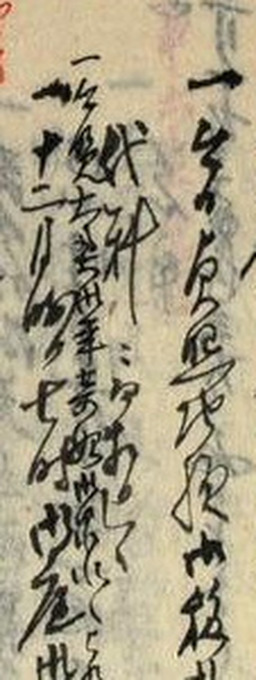代料ニ而相廻候
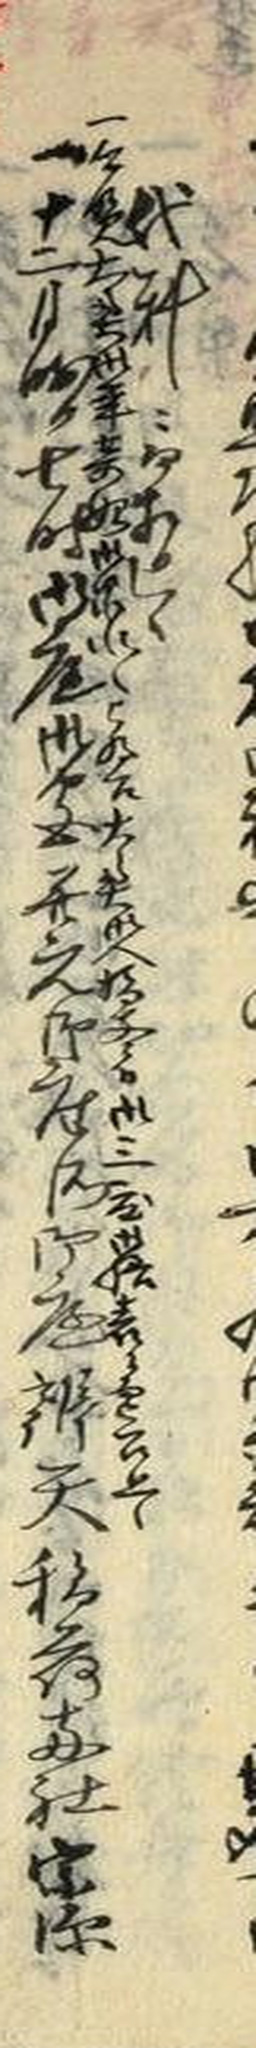一十二月晦日七時御庭御宮幷元御座所御庭弁天稲荷両社宗源
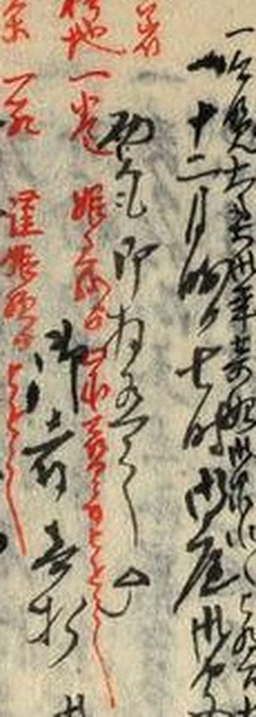殿も御拝有之△
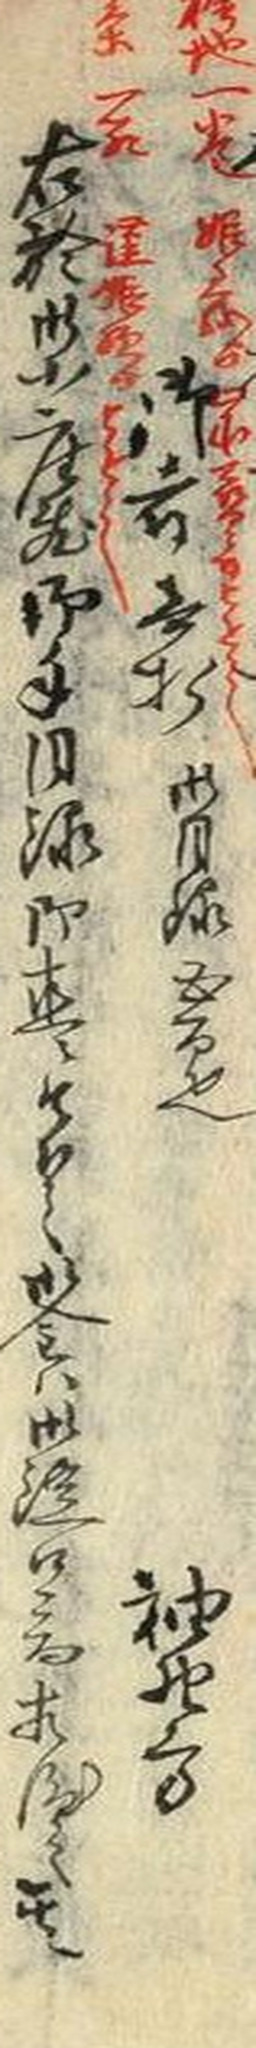右於御小座敷御手目録御直ニ被下之御金ハ御錠口ニ而相渡之其
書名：少傅日録抄（斉承付側向頭取日記、在国）
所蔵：福井県文書館 Fukui Prefectural Archives
